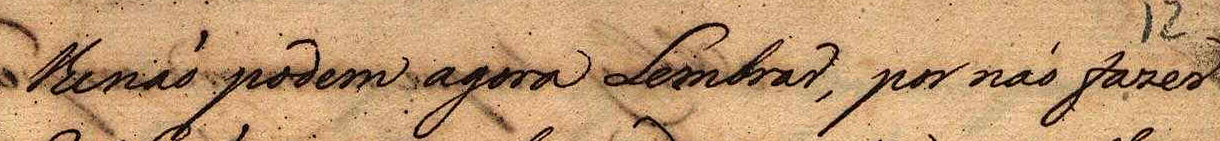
lhe naõ podem agora Lembrar, por naõ fazer
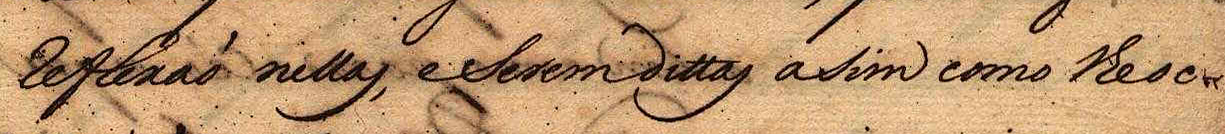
Reflexaõ nellas, e Serem dittas asim como lhes o
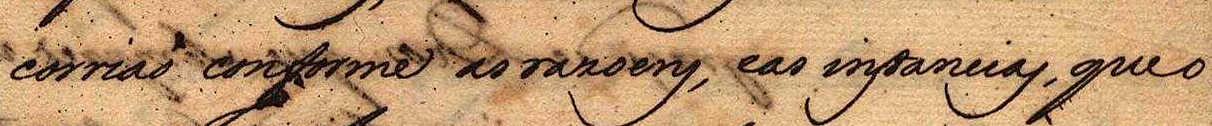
corriaõ conforme as razoens, e as instancias, que o
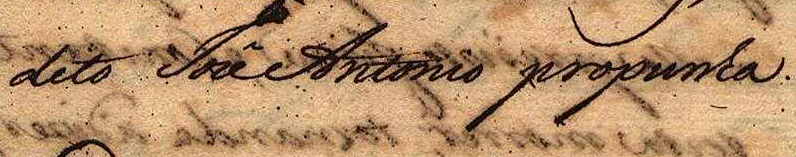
dito Iozé Antonio propunha.
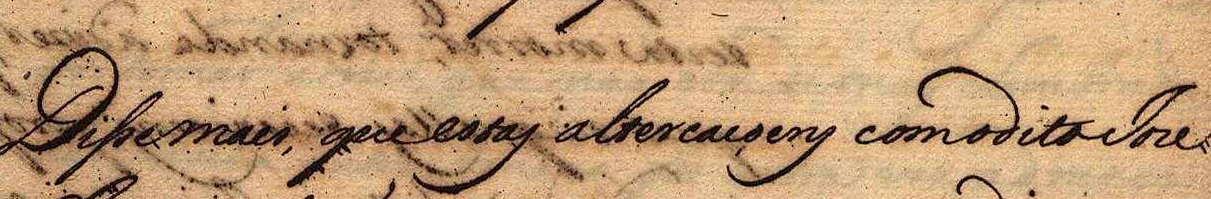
Disse mais, que estas altercaçoens com o dito Ioze
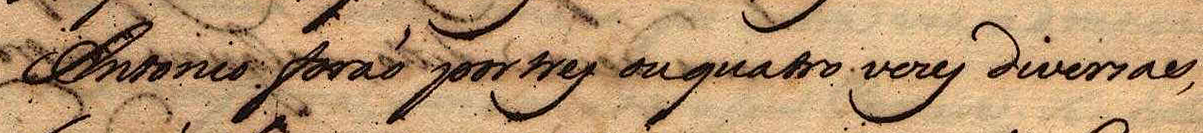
Antonio, foraõ por tres ou quatro vezes diversas,
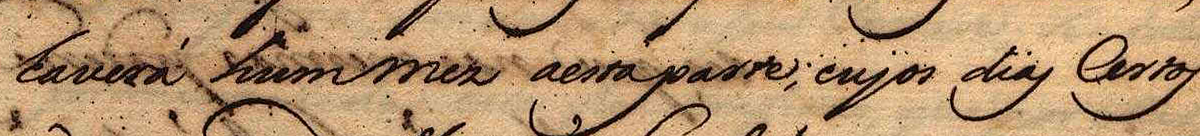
haverá hum mez a esta parte; cujos dias Certos
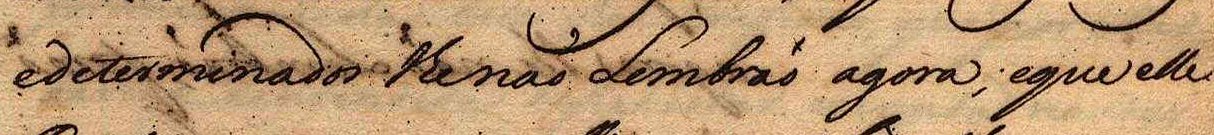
e determinados lhe naõ Lembraõ agora; e que elle
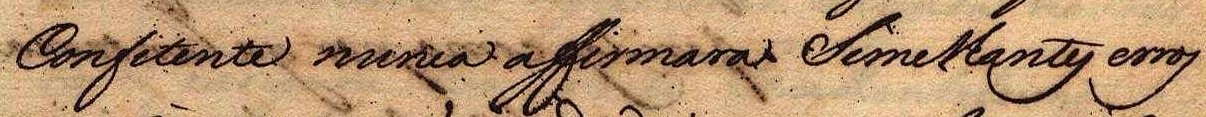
Confitente nunca affirmara Semelhantes erros
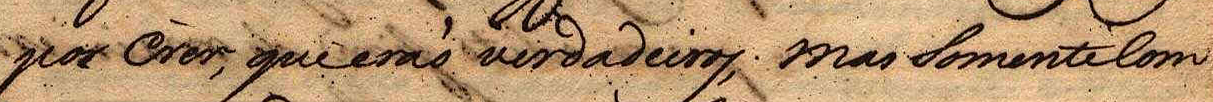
por crer, que eraõ verdadeiros; mas Somente Com
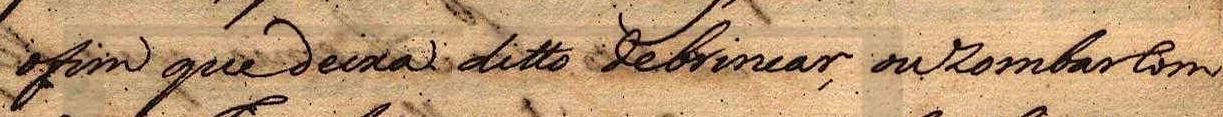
o fim que deixa ditto de brincar, ou zombar Com
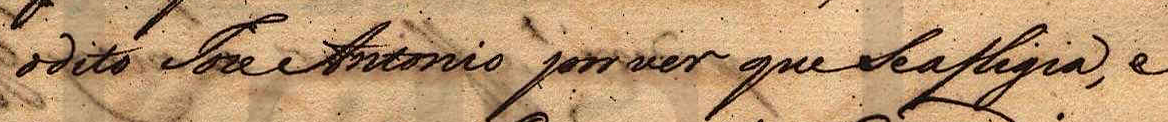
o dito Ioze Antonio por ver que Se afligia, e
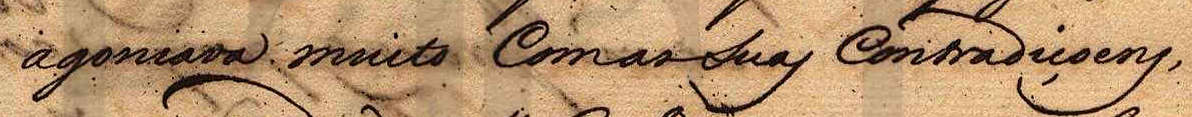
agoniava muito Com as Suas Contradiçoens,
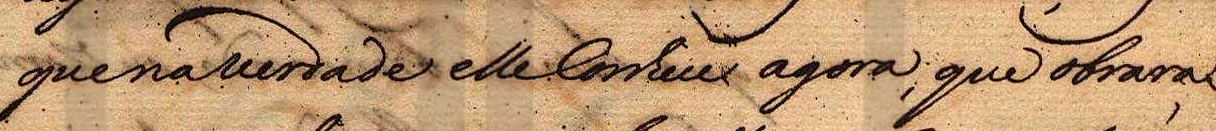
que na verdade elle Conhece agora; que obrara
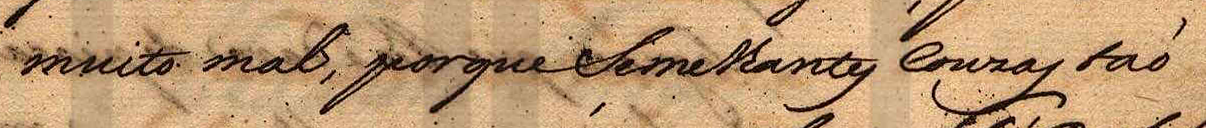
muito mal, porque Semelhantes couzas taõ
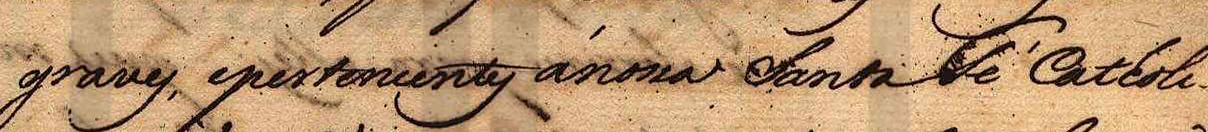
graves, e pertencentes á nossa Santa Fé Catholi
